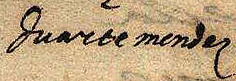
duarte mendez
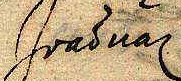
Joaõ uaz
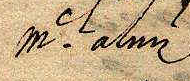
m.el alurz̄
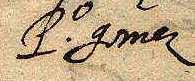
P.o gomez
